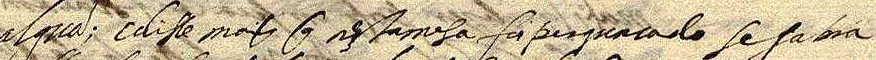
alguā; E disse mais q̄ nesta mesa foi perguntado se sabia
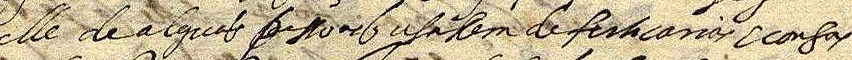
elle de alguas̄ pessoas q̄ usassem de feiticarias E cousas
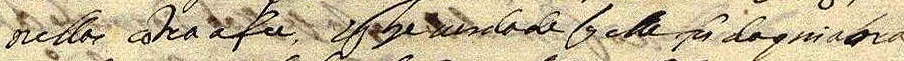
nellas cōtra a fee, E q̄ he uerdade q̄ elle foi daqui a bra
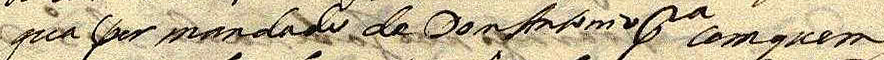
gua (per mandado de Dom Antonio pra com quem
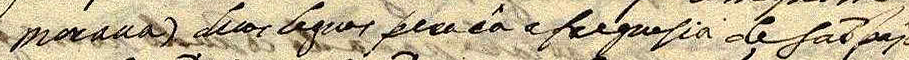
moraua) duas leguas pera câ a freguesia de saõ pajo
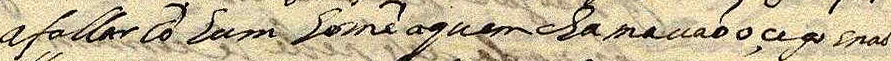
a fallar cō hum homē a quem chamauaõ o çego E naõ
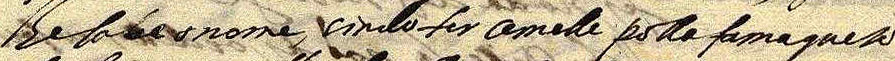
lhe sabe o nome, E indo ter com elle polla fama que tē
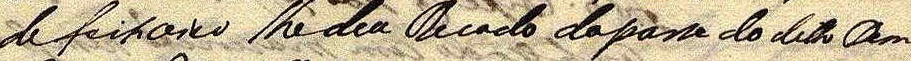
de feiticeiro lhe deu Recado da parte do ditto Dom
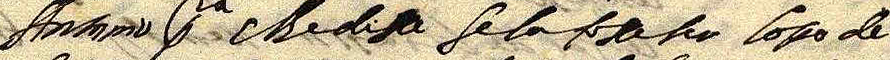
Antonio pra E lhe disse se la fosse ter lopo de
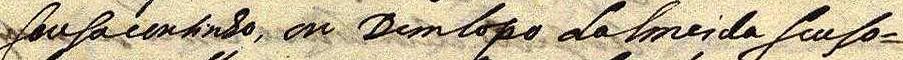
sousa coutinho, ou Dom lopo dalmeida seu so
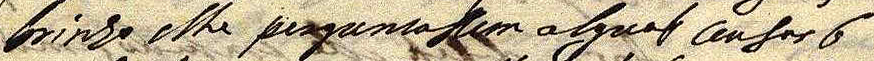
brinho e lhe perguntassem alguas̄ cousas q̄
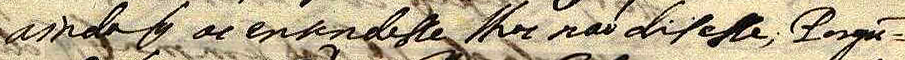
ainda q̄ as entendesse lhas naõ disesse; Pergū
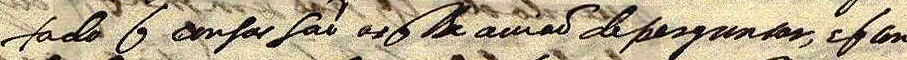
tado q̄ cousas saõ as q̄ lhe auiaõ de perguntar, E q̄ cou
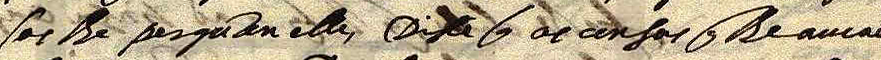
sas lhe pergūtou elle, Disse q̄ as cousas q̄ lhe auiaõ
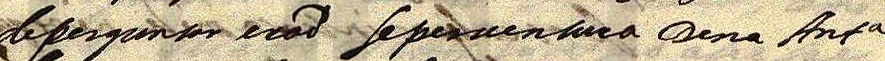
de perguntar eraõ se per uentura Dona Anta
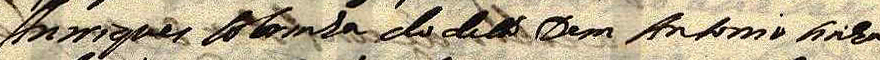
Anriques sobrinha do ditto Dom Antonio tinha
